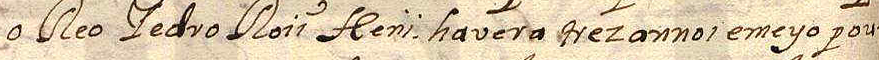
o Reo Pedro Rois̄ Hens̄. havera trez annos e meyo pou
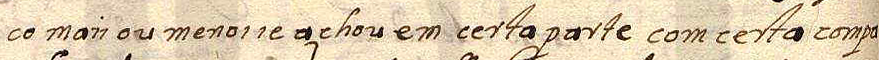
co mais ou menos se achou em certa parte com certa compa
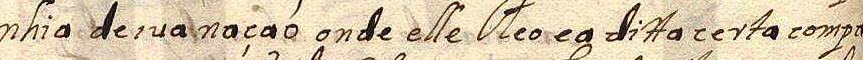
nhia de sua naçaõ onde elle Reo e a ditta certa compa
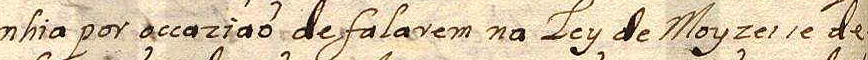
nhia por occaziaõ de falarem na Ley de Moyzes se de
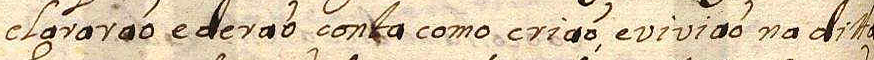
clararaõ e deraõ conta como criaõ, e viviaõ na ditta
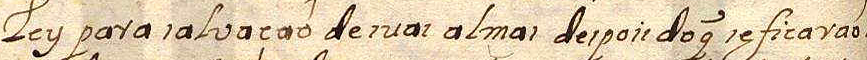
Ley para salvaçaõ de suas almas despois do q̄ se ficaraõ
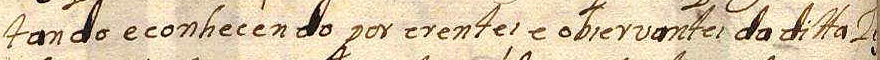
tando e conhecendo por crentes, e observantes da ditta L
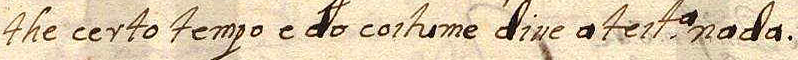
the o certo tempo e do costume disse a test.a nada.
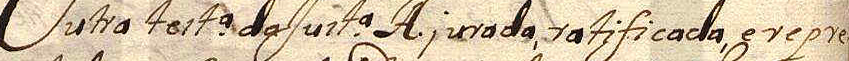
Outra test.a da Just.a A. jurada, ratificada, e repre
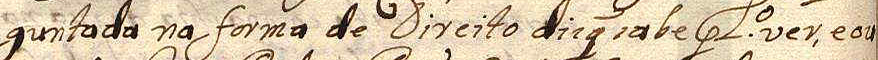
guntada na forma de Direito dis q̄ sabe pL.o ver, e ou
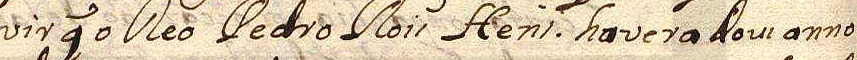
vir q̄ o Reo Pedro Rois̄ Hen̄s̄. havera dous annos
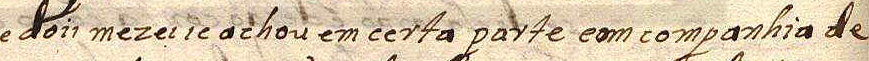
e dois mezes se achou em certa parte em companhia de
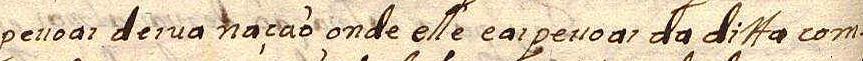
pessoas de sua naçaõ onde elle e as pessoas da ditta com
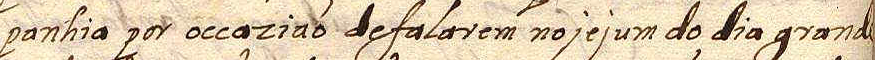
panhia por occaziaõ de falarem no jejum do dia grand
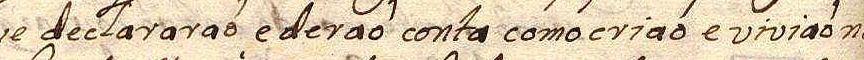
se declararaõ, e deraõ conta como criaõ e viviaõ na
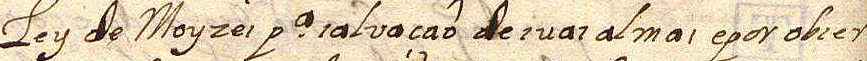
Ley de Moyzes p.a salvaçaõ de suas almas e por obser
